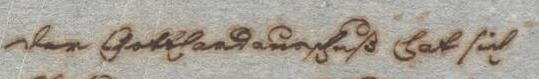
Der Gotthardausschuß hat sich
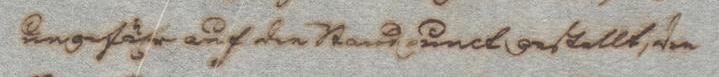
ungefähr auf den Standpunct gestellt, den
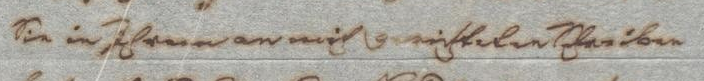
Sie in Ihrem an mich gerichteten Schreiben
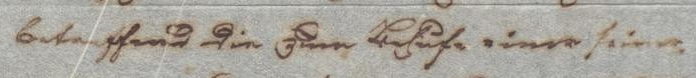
betreffend die zum Behufe einer seiner-
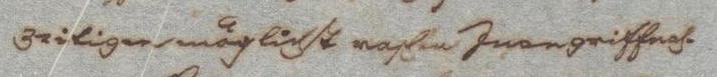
zeitigen möglichst raschen Inangriffnah-
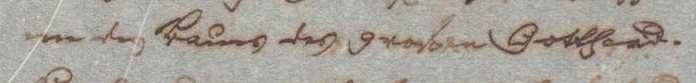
me des Baues des großen Gotthard -
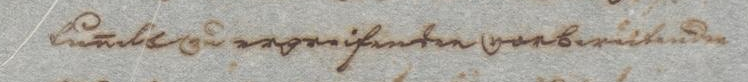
tunnels zu ergreifenden vorbereitenden
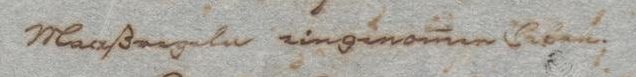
Maaßregeln eingenommen haben.
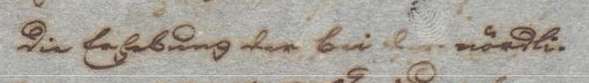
Die Erhebung der bei der nördli-
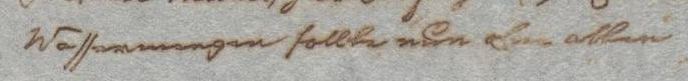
Wassermengen sollte nun ohne allen
